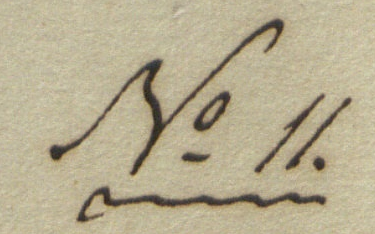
No 11.
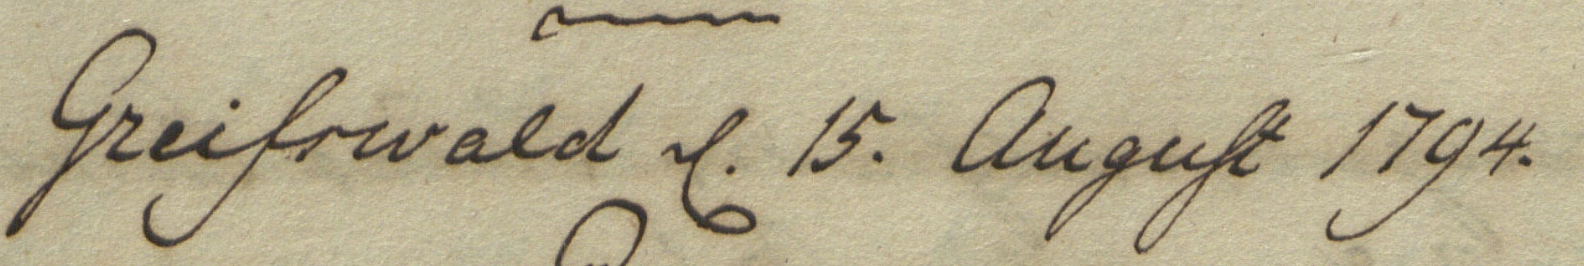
Greifswald d. 15. August 1794.
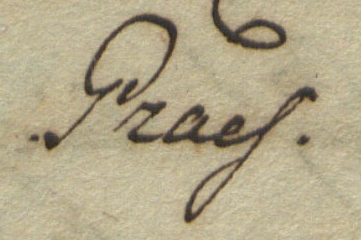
Praes.
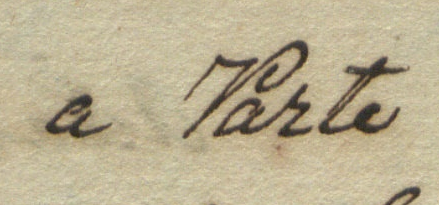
a Parte
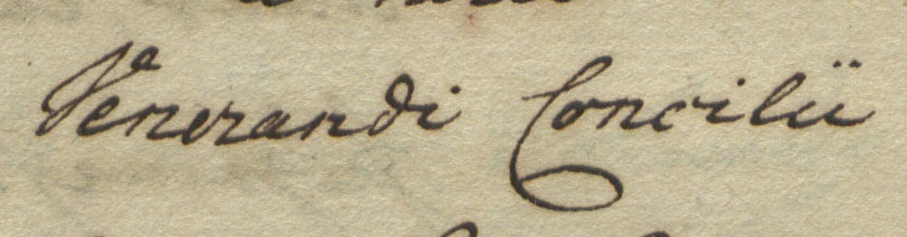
Venerandi Concilii
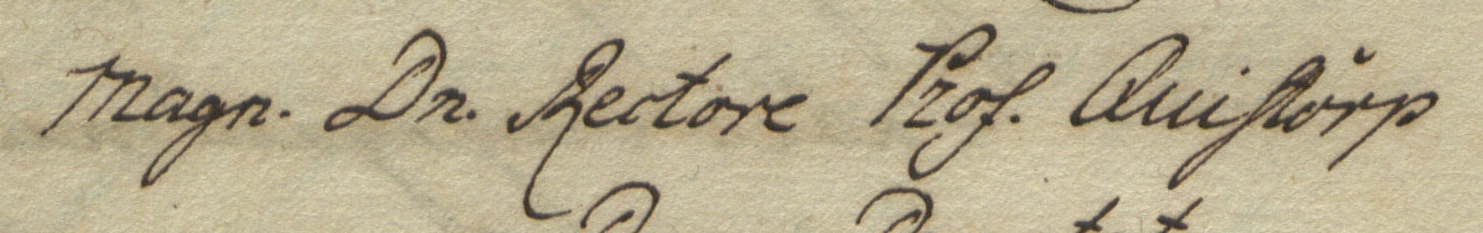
Magn. Dn. Rectore Prof. Quistorp
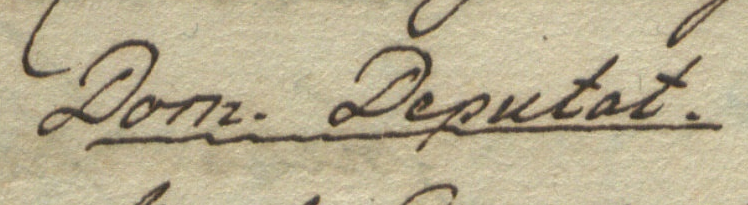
Dom. Deputat.
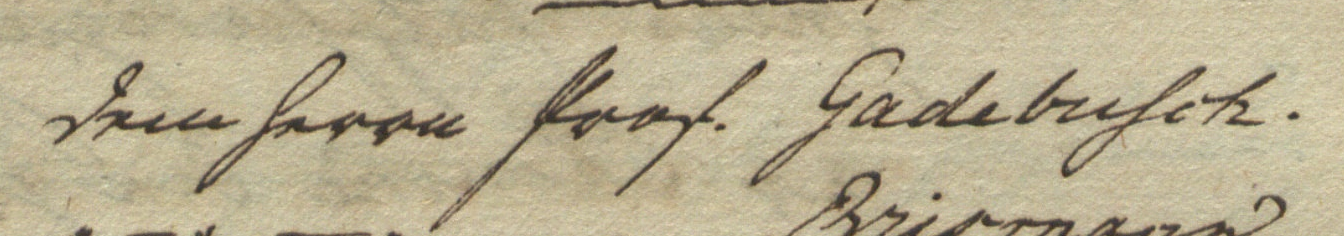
dem Herrn Prof. Gadebusch.
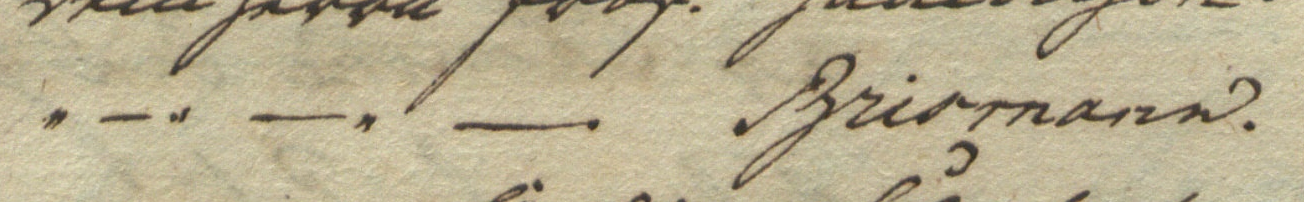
Brismann.
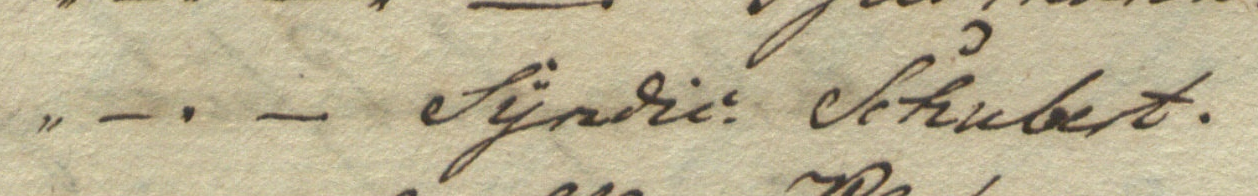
Sÿndic. Schubert.
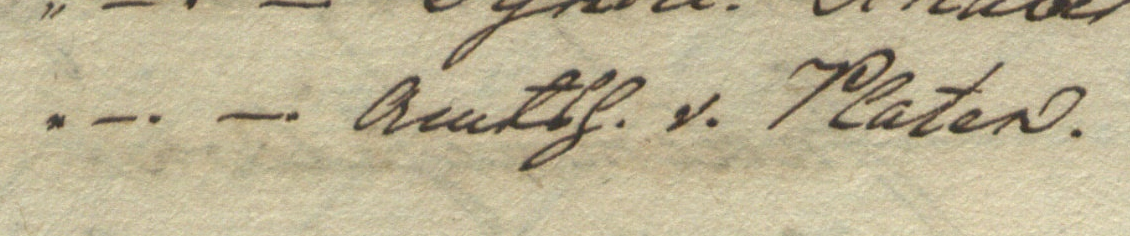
Amtsh. v. Platen.
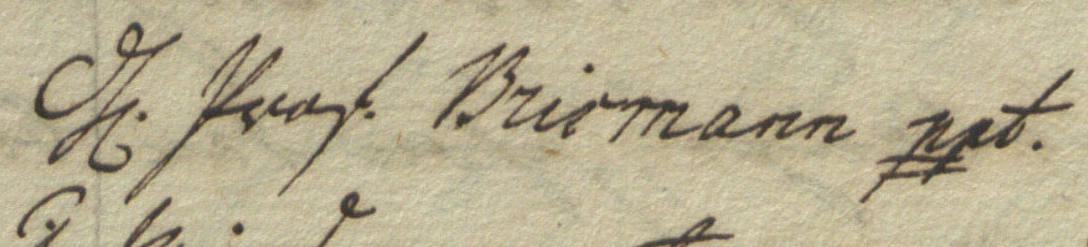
dh. Prof. Brismann ppt.
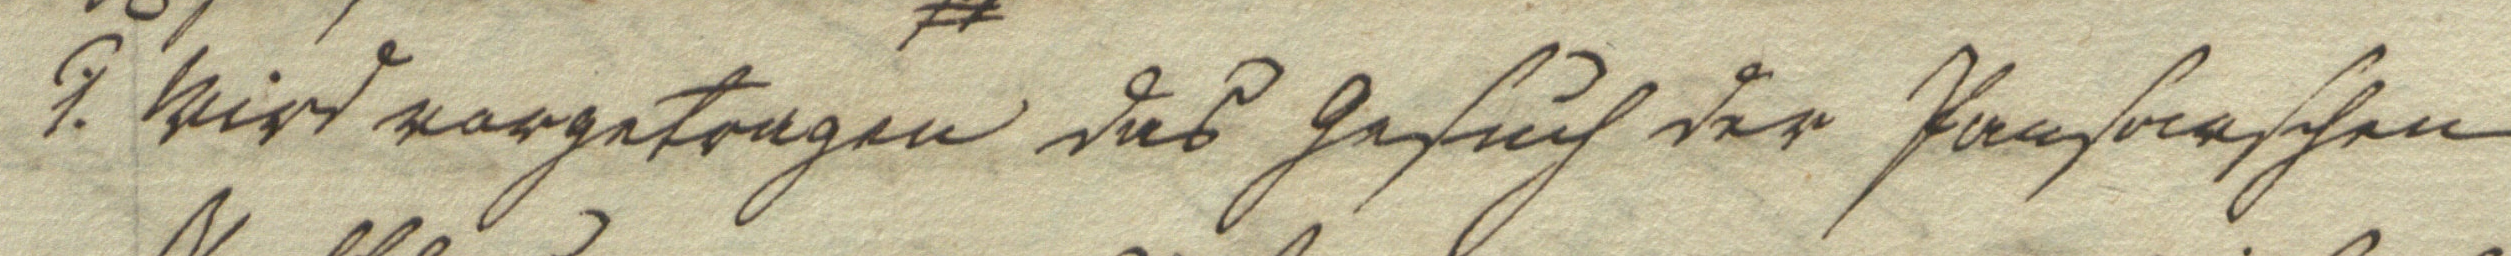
1. Wird vorgetragen das Gesuch der Pansowschen
